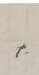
27.
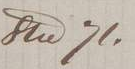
8bre 71.
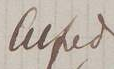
Escher
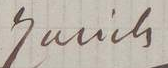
Zurich
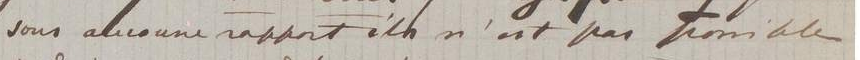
sous aucune rapport ils n'est pas possible
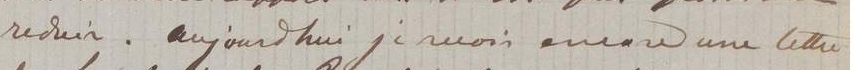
reduir. Aujourd'hui je recois encore une lettre
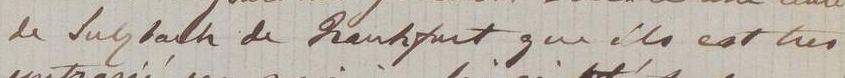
de Sulzbach de Frankfort que ils est tres
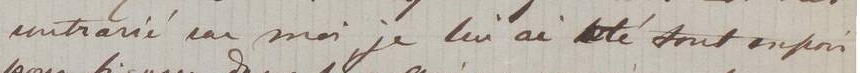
contrarie car moi je lui ai eté tout espoir
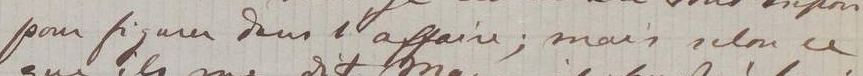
pour figurer dans l'affaire; mais selon ce
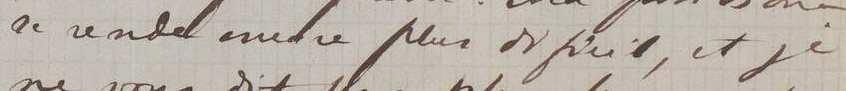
se rende encore plus dificil, et je
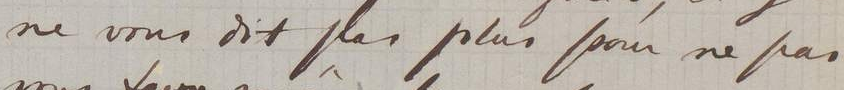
ne vous dit pas plus pour ne pas
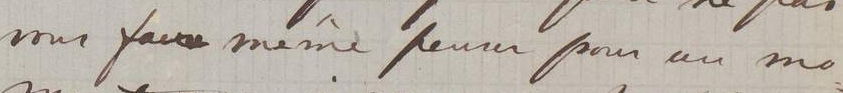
vous faire même penser pour un mo-
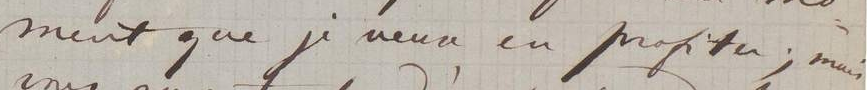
ment que je veux en profiter; mais
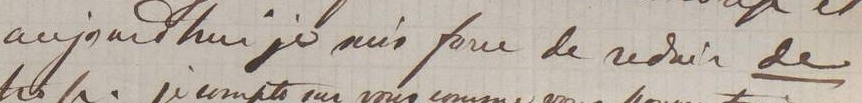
aujourdhui je suis force de reduir de
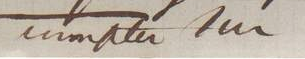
compter sur
